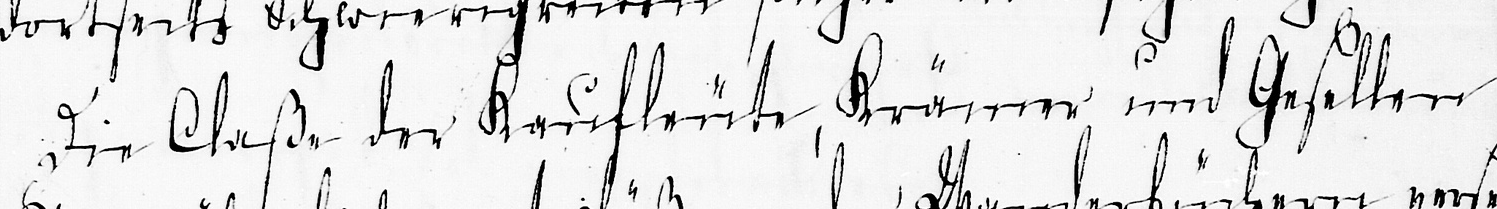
Die Claße der Kaufleute, Krämer und Gesellen
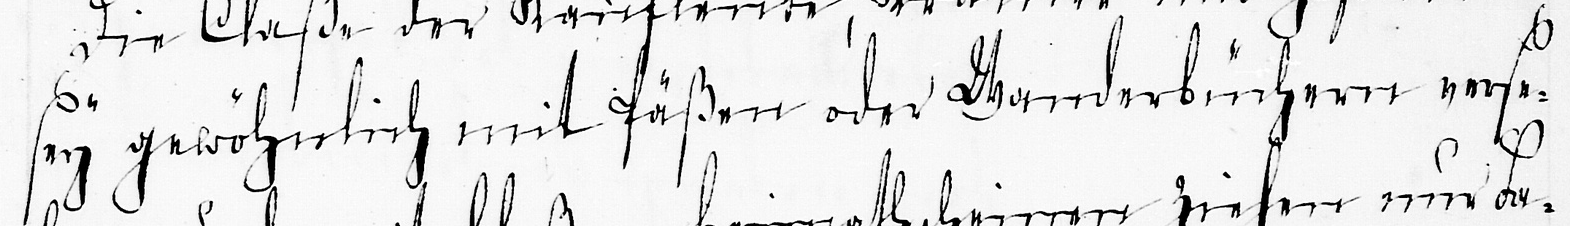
sey gewöhnlich mit Päßen oder Wanderbüchern verse¬
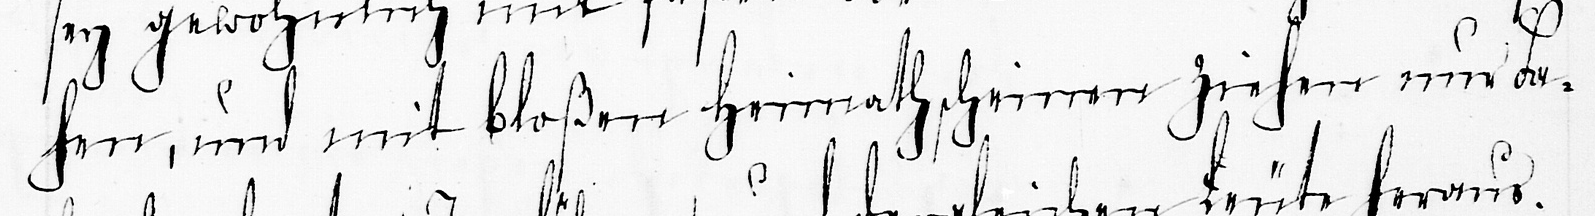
hen, und mit bloßen Heimathscheinen ziehen nur Fa¬
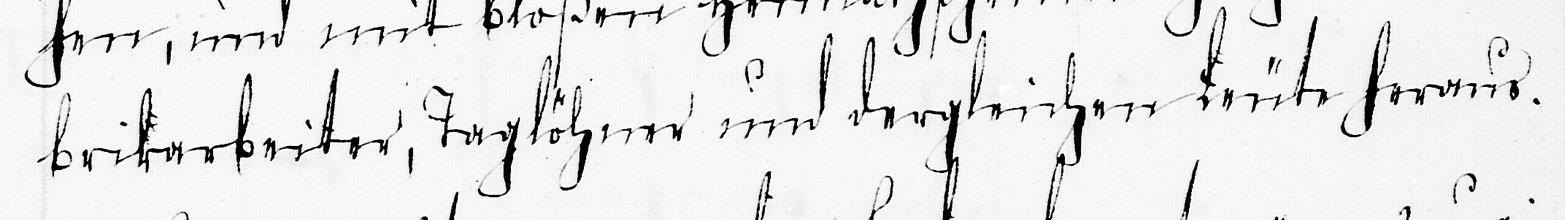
brikarbeiter, Taglöhner und dergleichen Leute heraus.
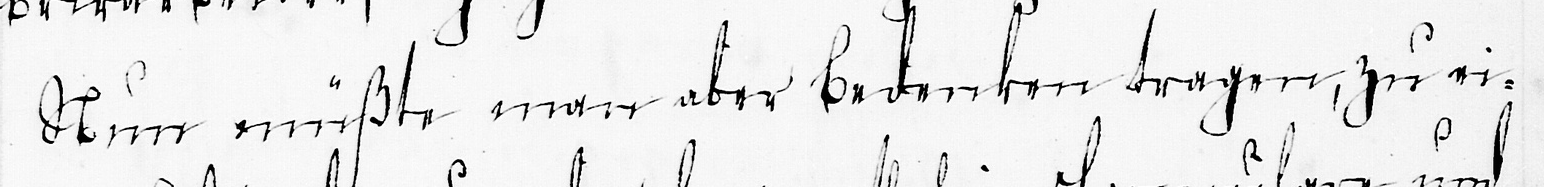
Nun müßte man aber Bedenken tragen, zu ei¬
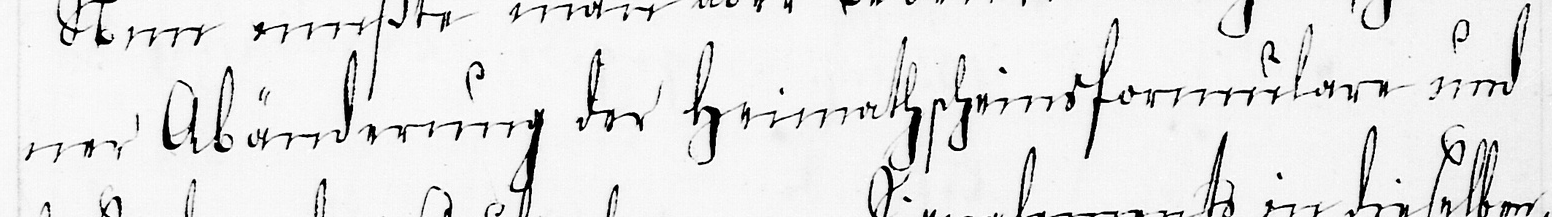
ner Abänderung der Heimathscheinsformulare und
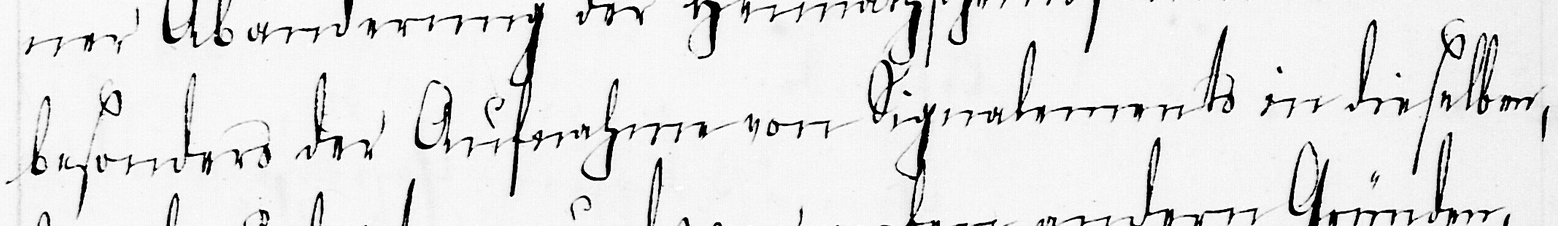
besonders der Aufnahme von Signalements in dieselben,
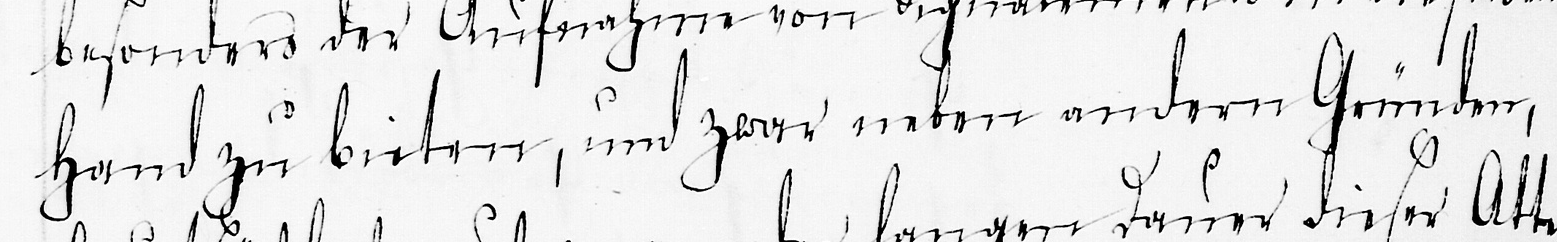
Hand zu bieten, und zwar neben andern Gründen,
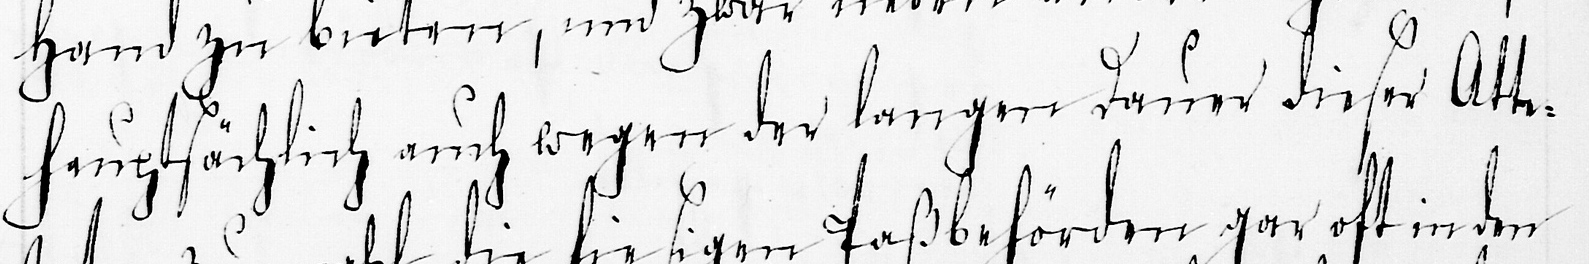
hauptsächlich auch wegen der langen Dauer dieser Atte¬
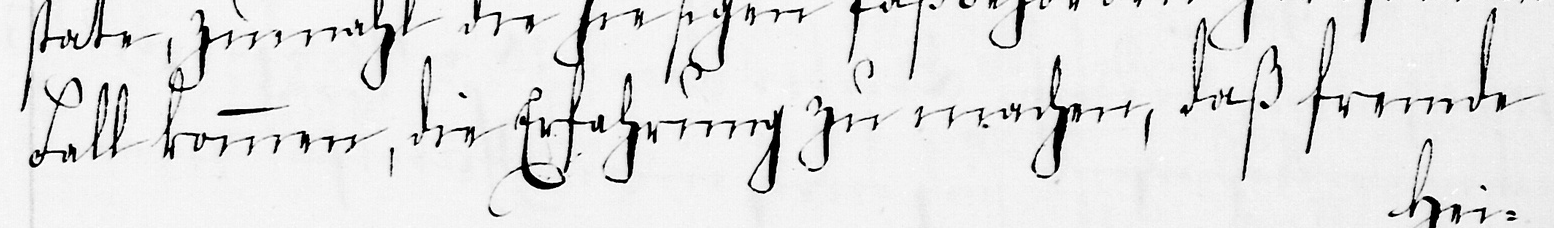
Fall kommen, die Erfahrung zu machen, daß fremde
